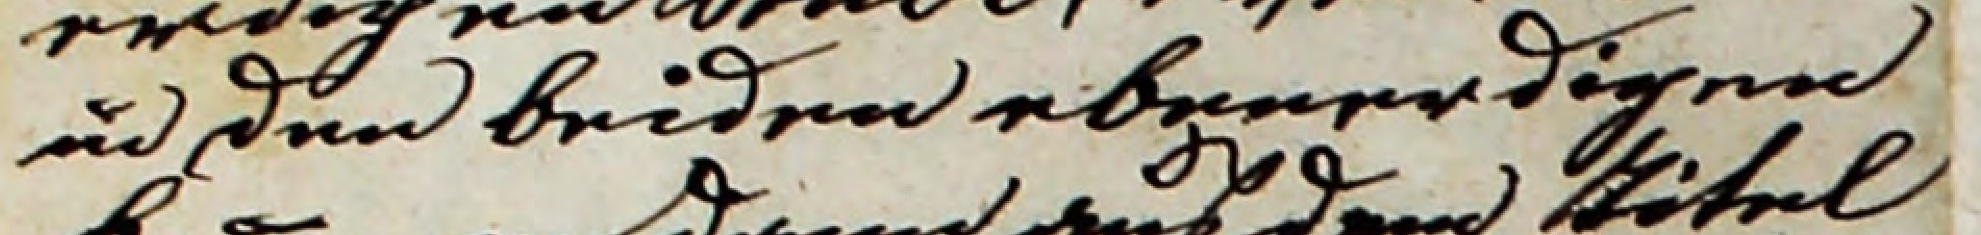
in den beiden ebenerdigen
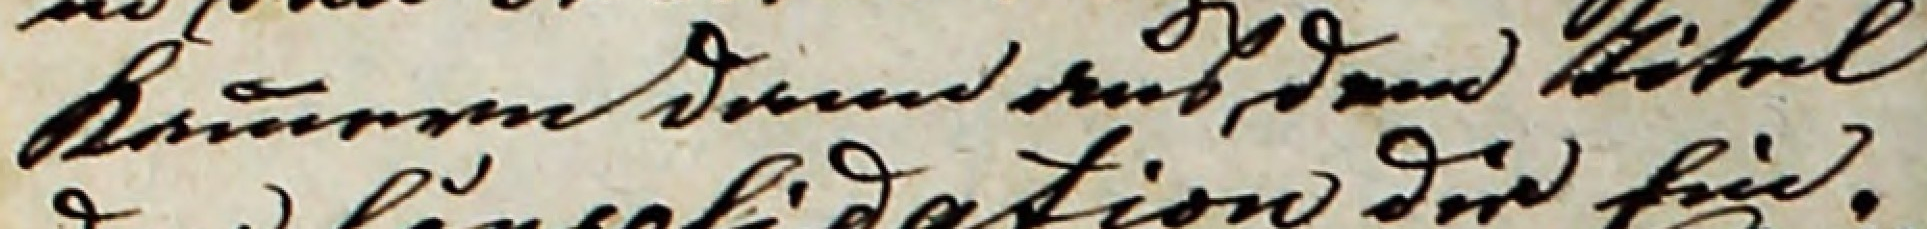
Kammern dann aus dem Titel
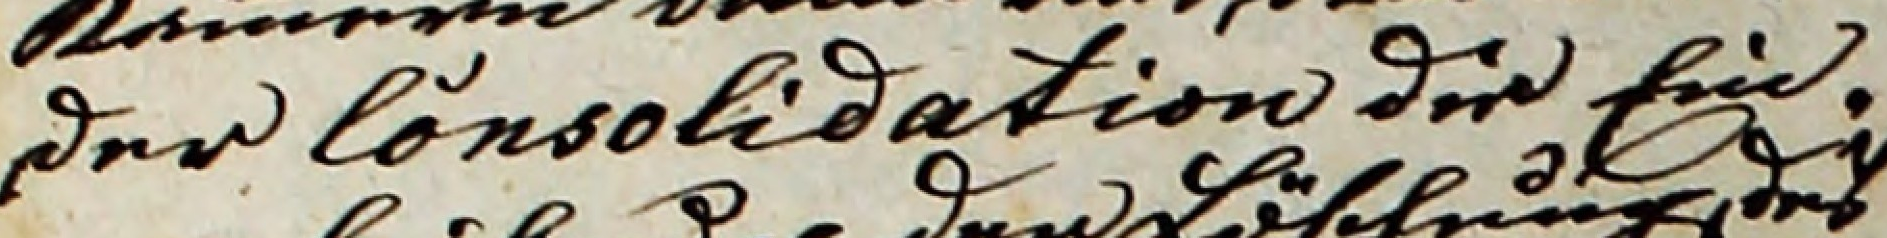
der Consolidation die Ein„
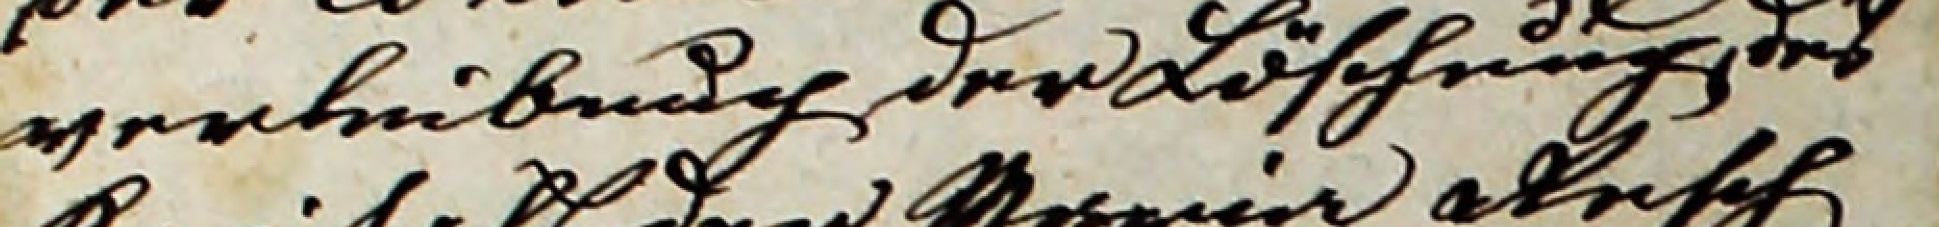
verleibung der Löschung des
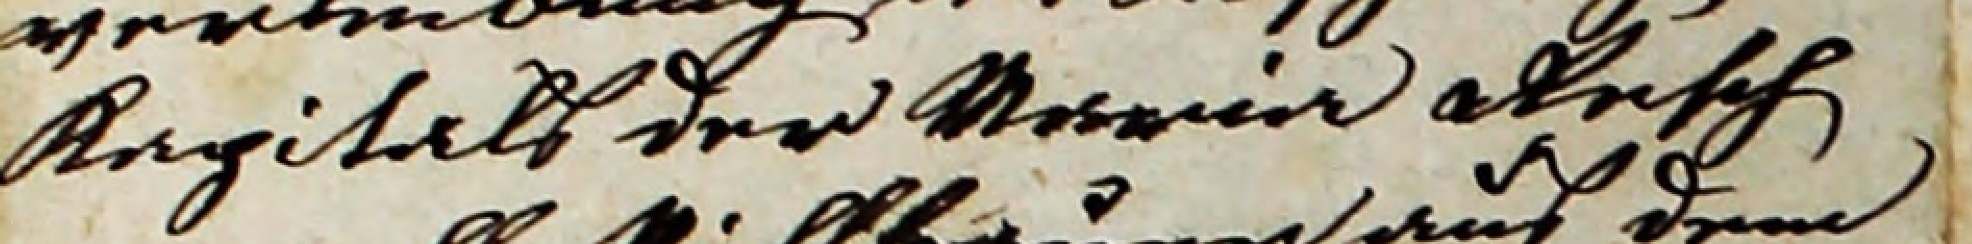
Kapitals der Maria Resch
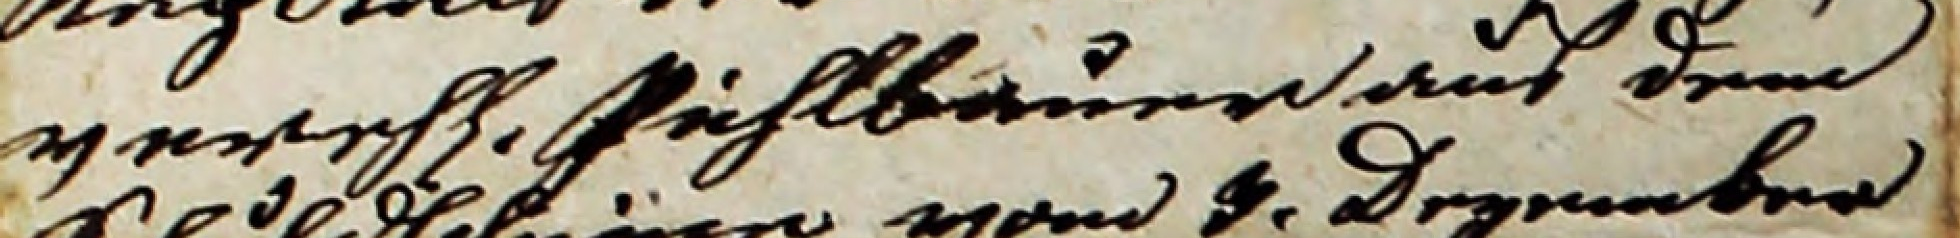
verehh. Pichlbauer aus dem
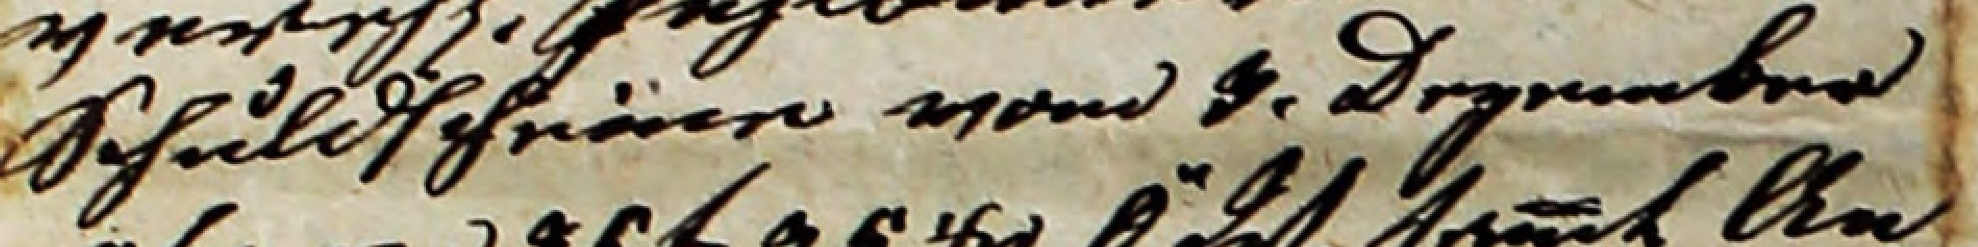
Schuldscheine vom 3. Dezember
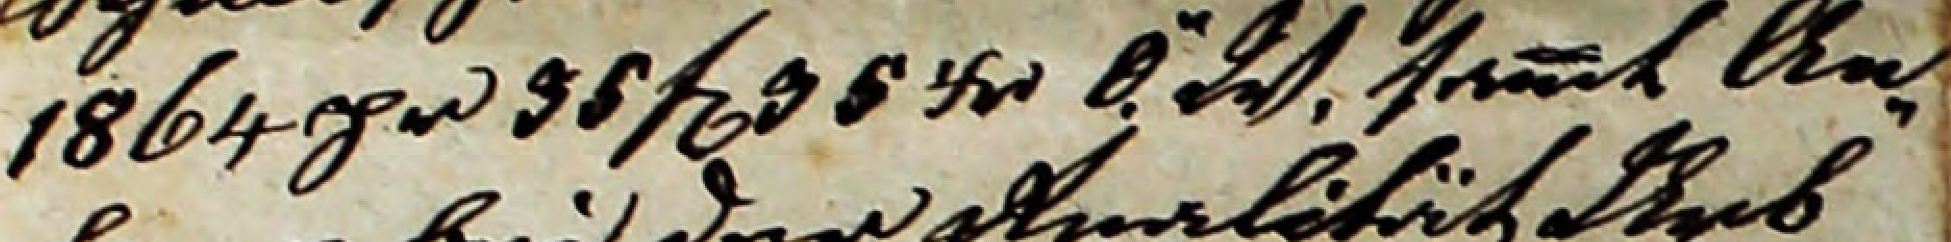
1864 pr 35 f. 354 Ö.W. sammt An„
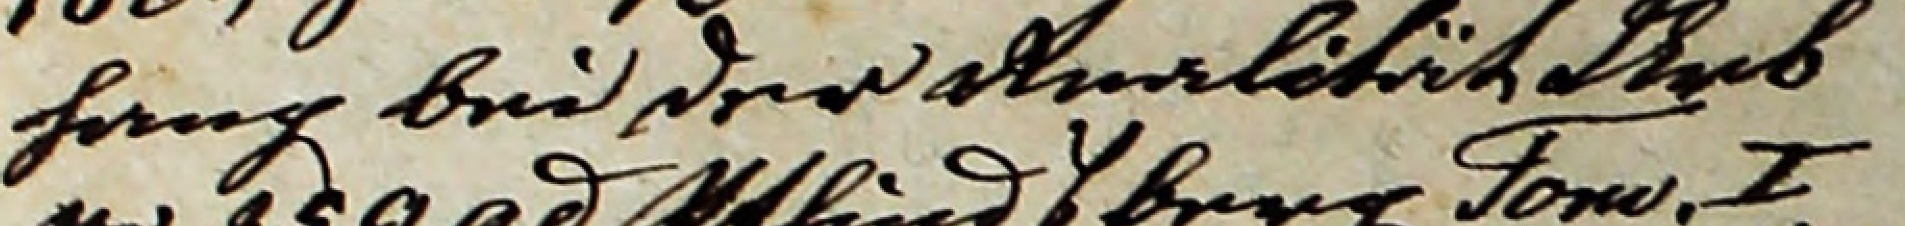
hang bei der Realität Urb
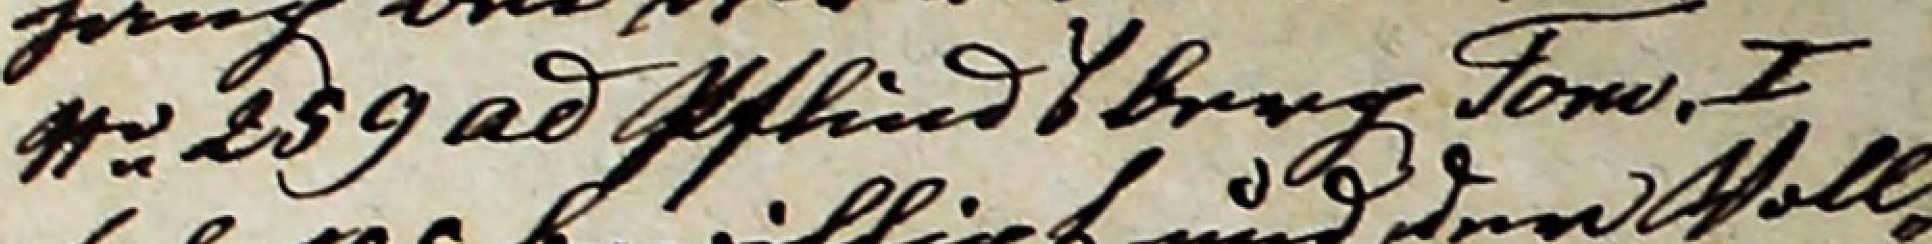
No 259 ad Pflindsberg Tom. I
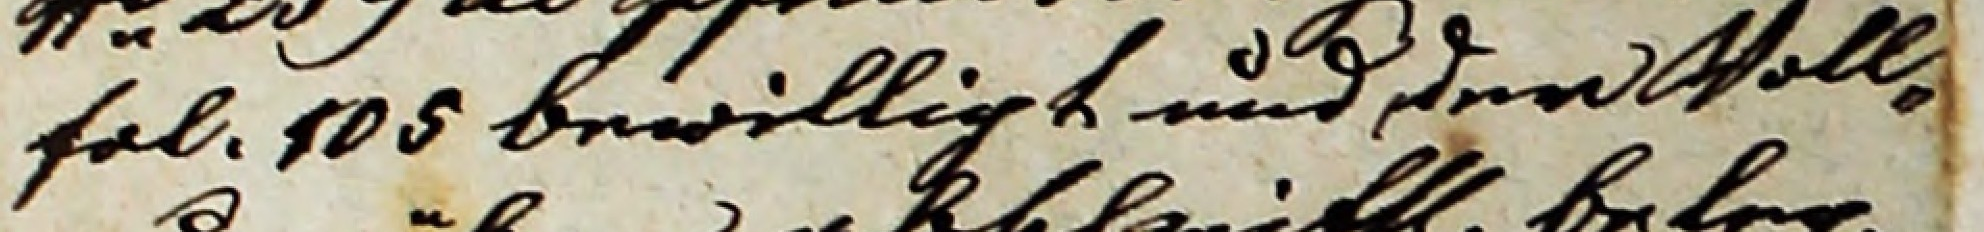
fol. 105 bewilligt und der Voll„
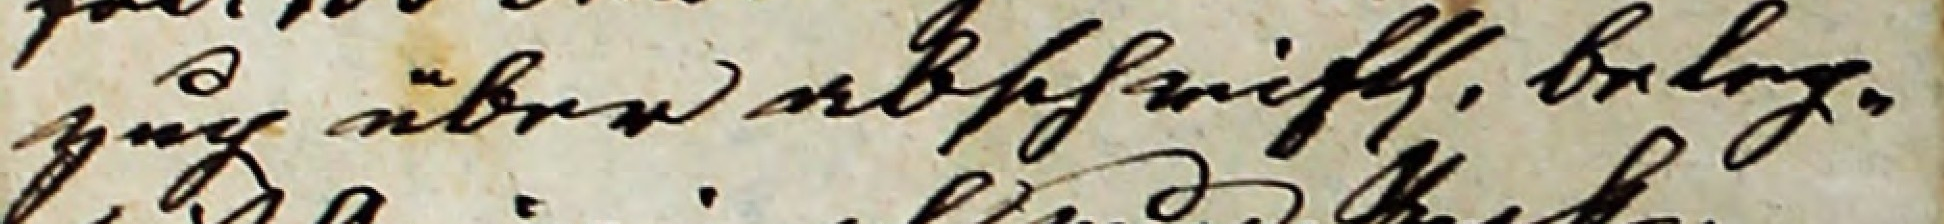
zug über abschriftl. beleg„
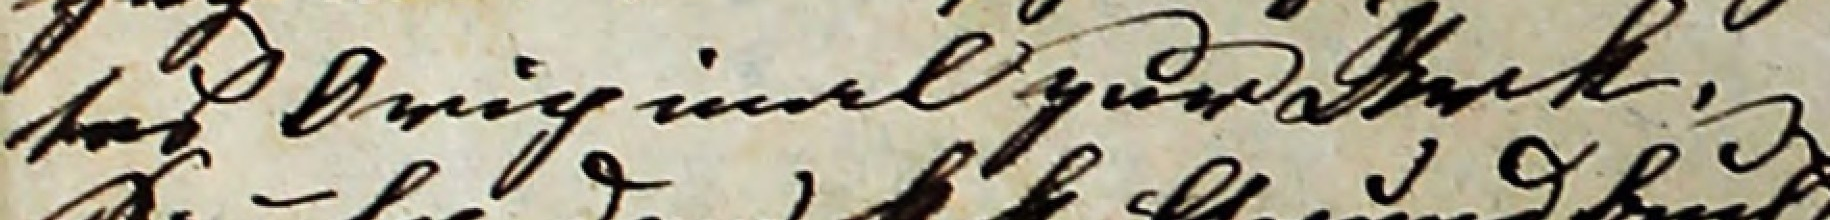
tes Original zur Urk.
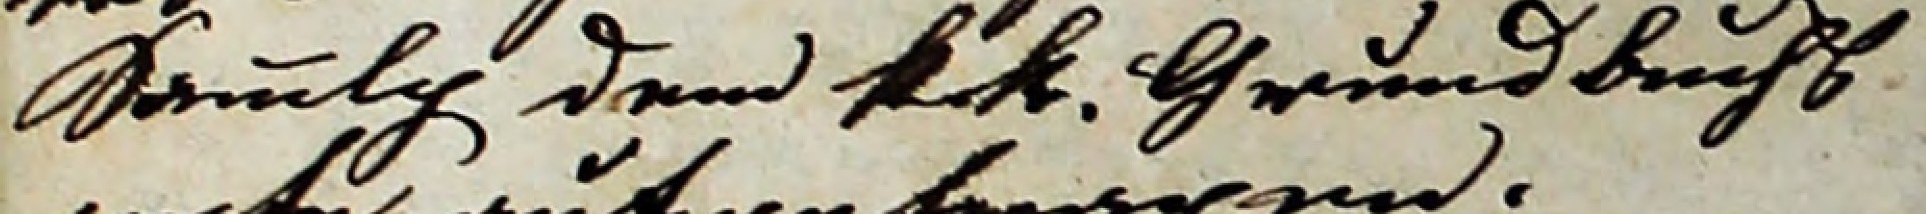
Sammtg dem kk. Grundbuchs
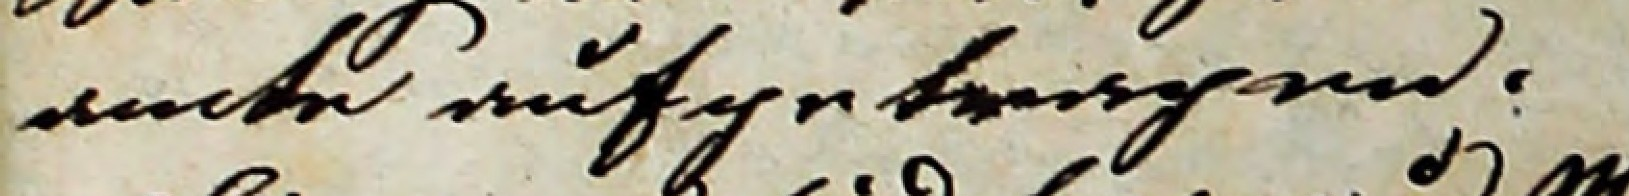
amte aufgetragen.
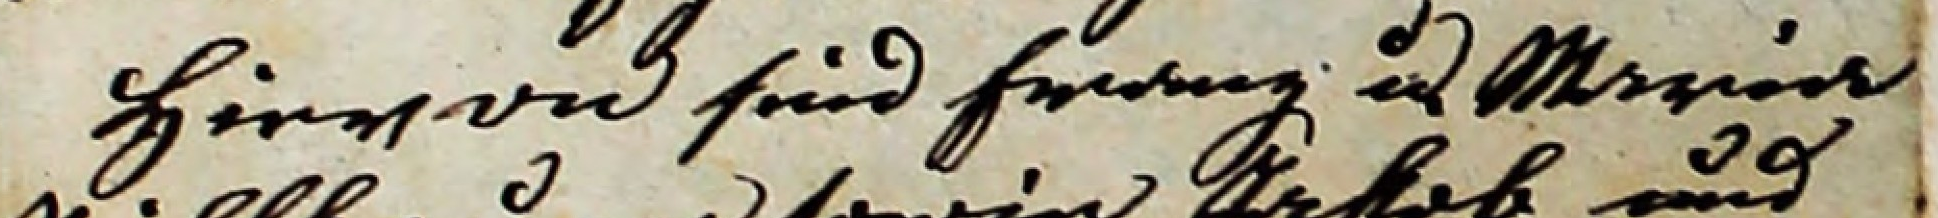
Hievon sind Franz u. Maria
